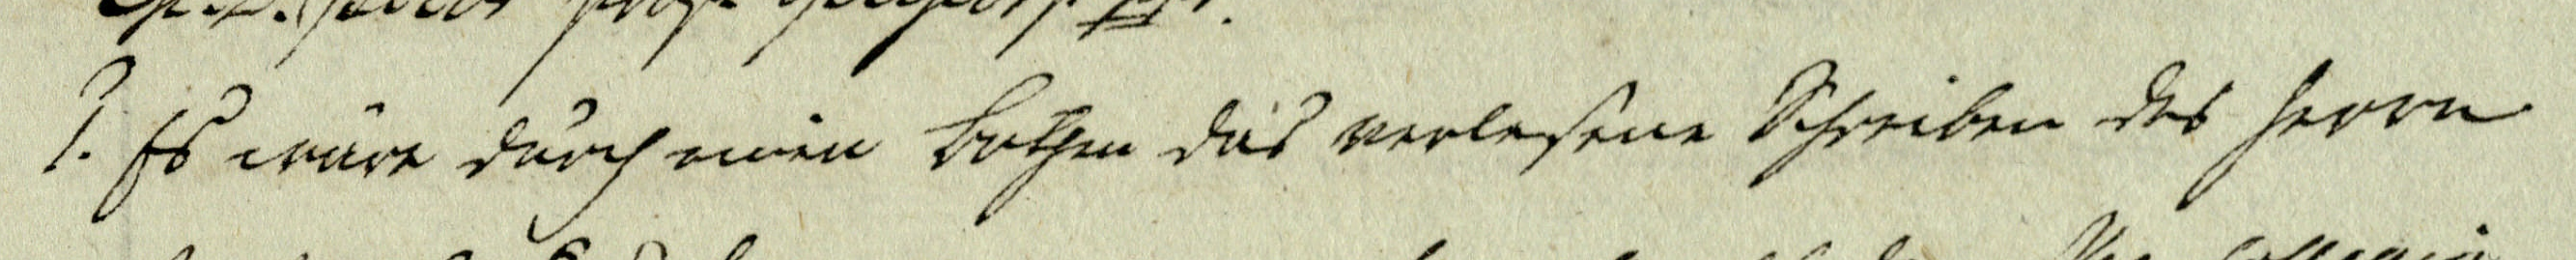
1. Es wäre durch einen Bothen das verlesene Schreiben des Herrn
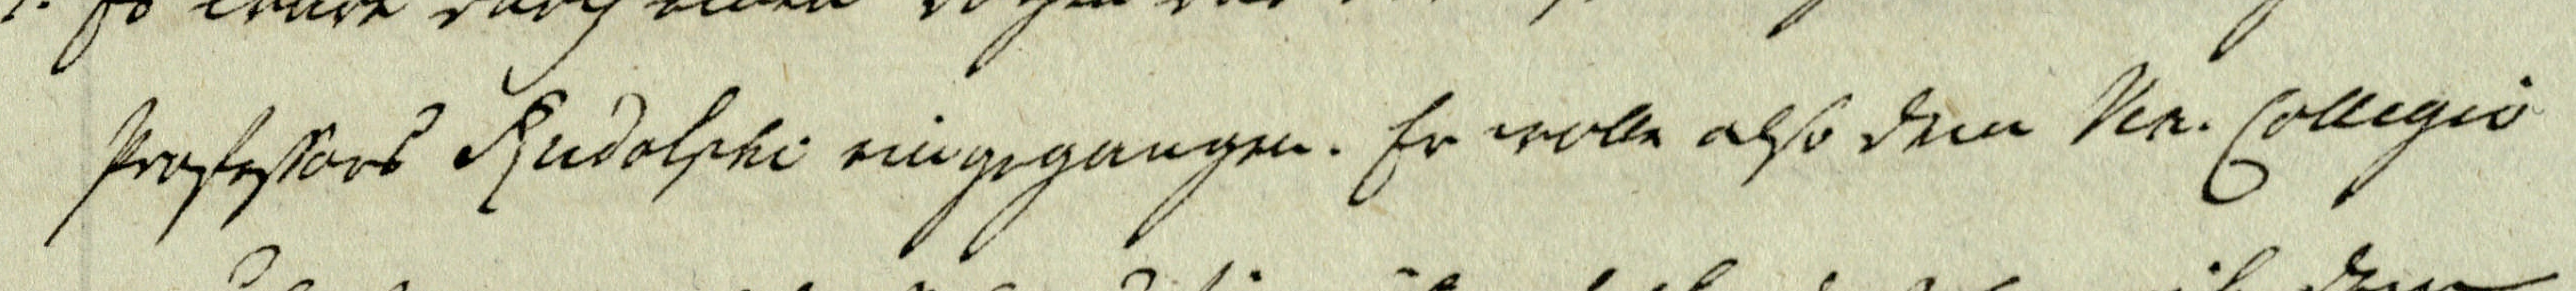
Professors Rudolphi eingegangen. Er wolle also dem Ven. Collegio
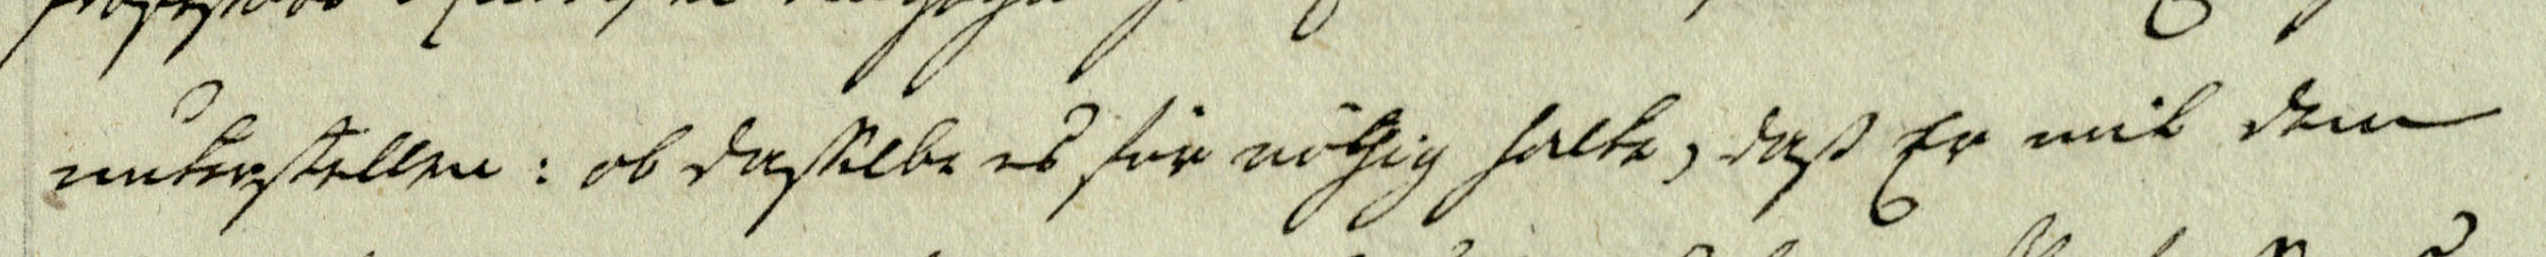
unterstellen: ob dasselbe es für nöthig halte, daß Er mit dem
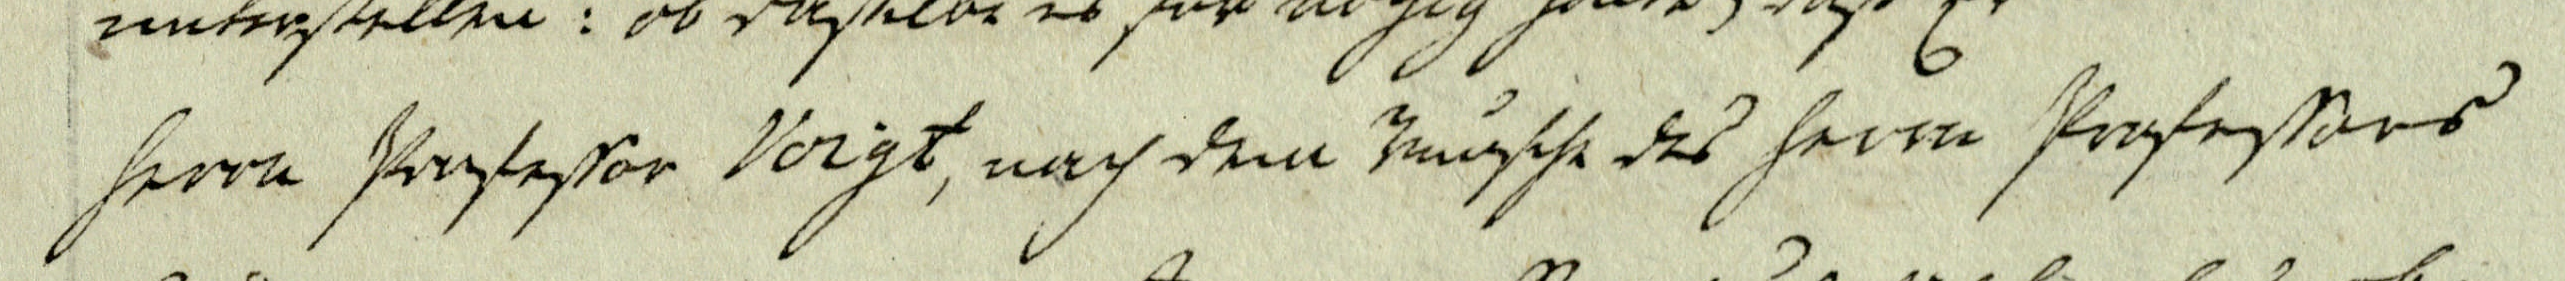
Herrn Professor Voigt, nach dem Wunsche des Herrn Professors
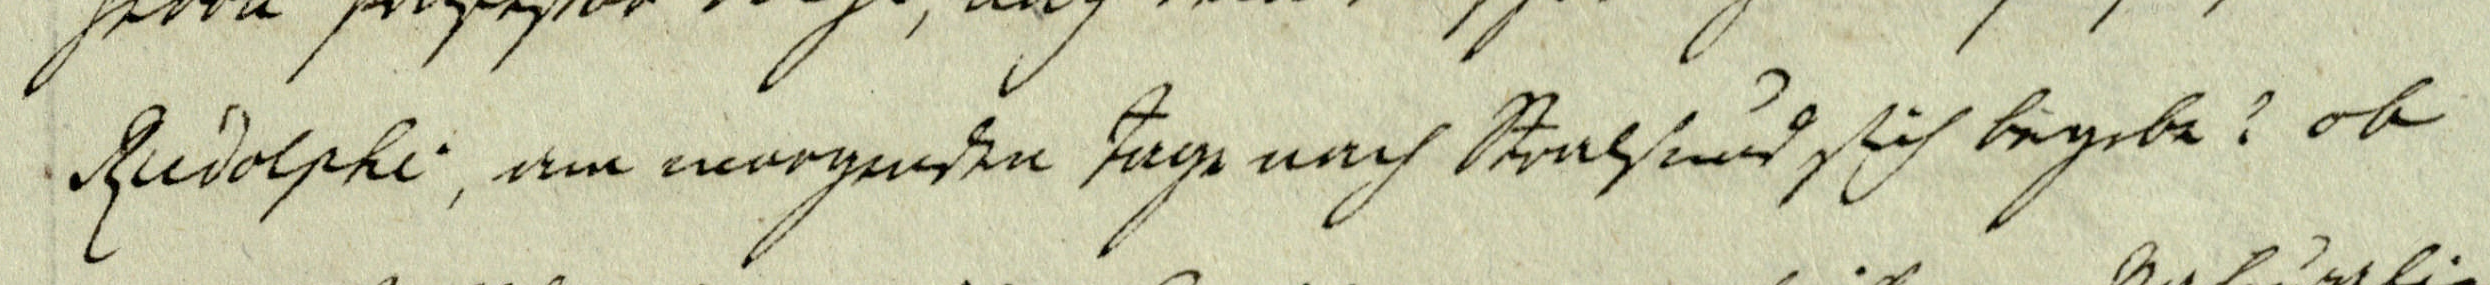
Rudolphi, am morgenden Tage nach Stralsund sich begebe? ob
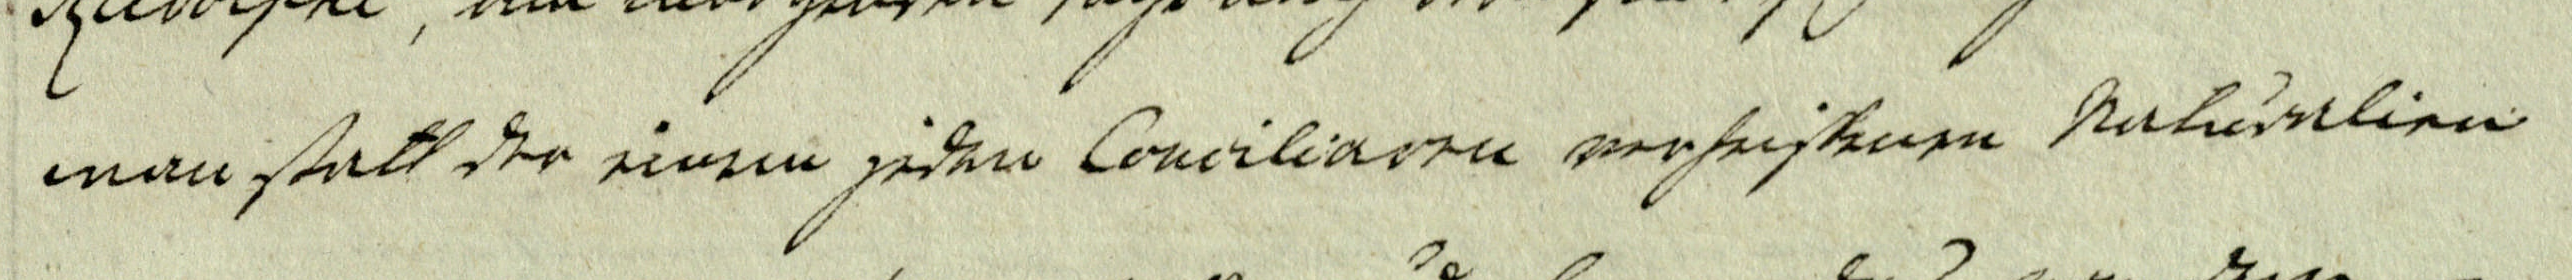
man statt der einem jeden Conciliaren verheissenen Naturalien
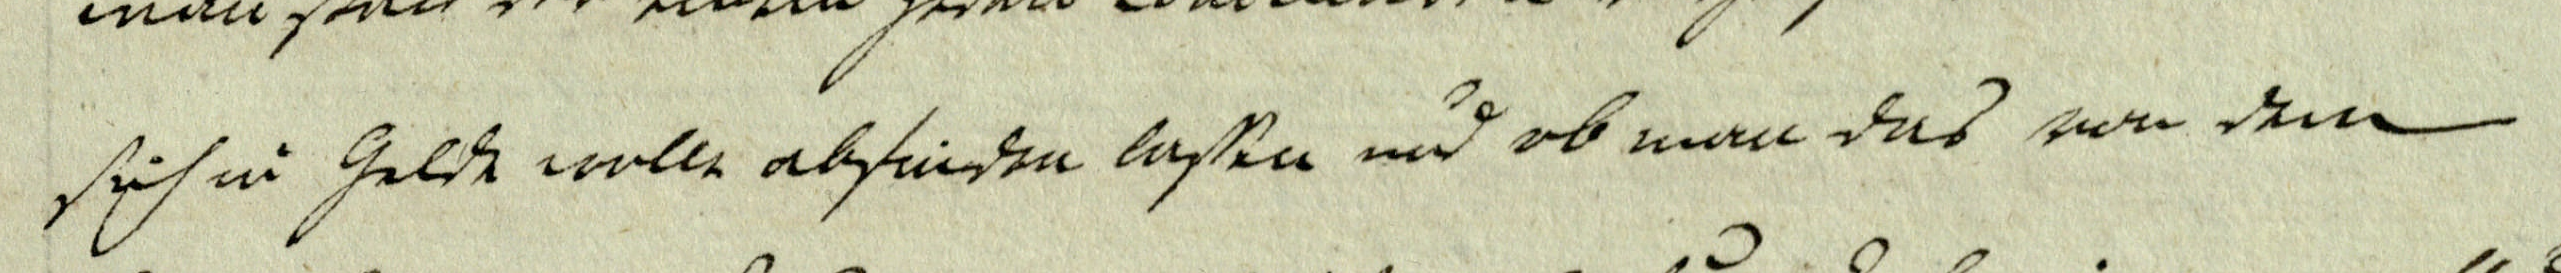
sich in Gelde wolle abfinden lassen und ob man das von dem
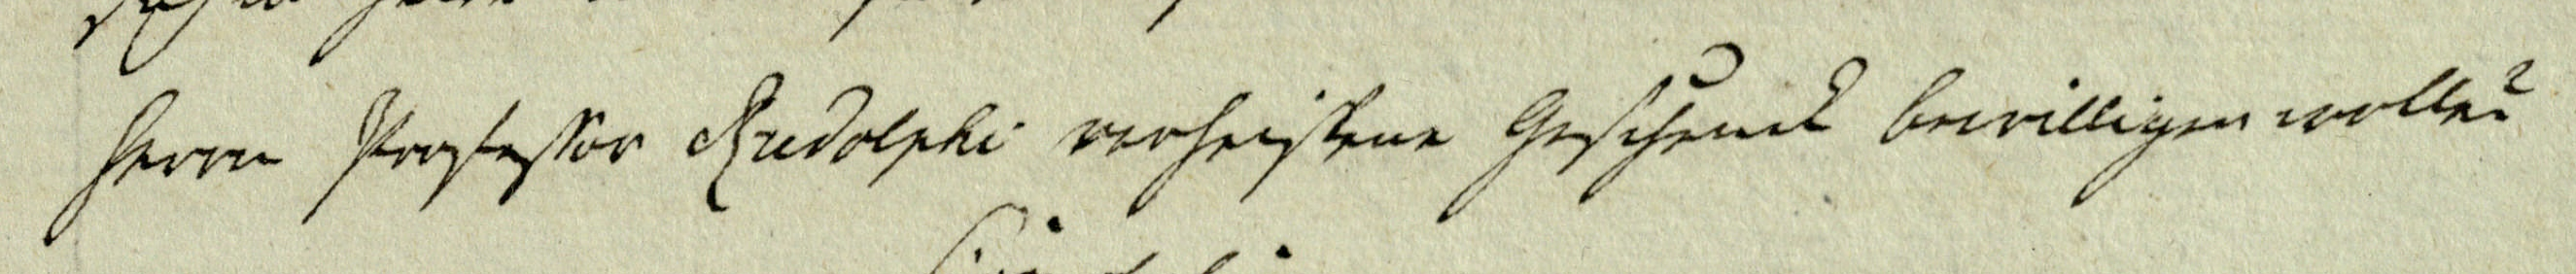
Herrn Professor Rudolphi verheissene Geschenk bewilligen wolle?
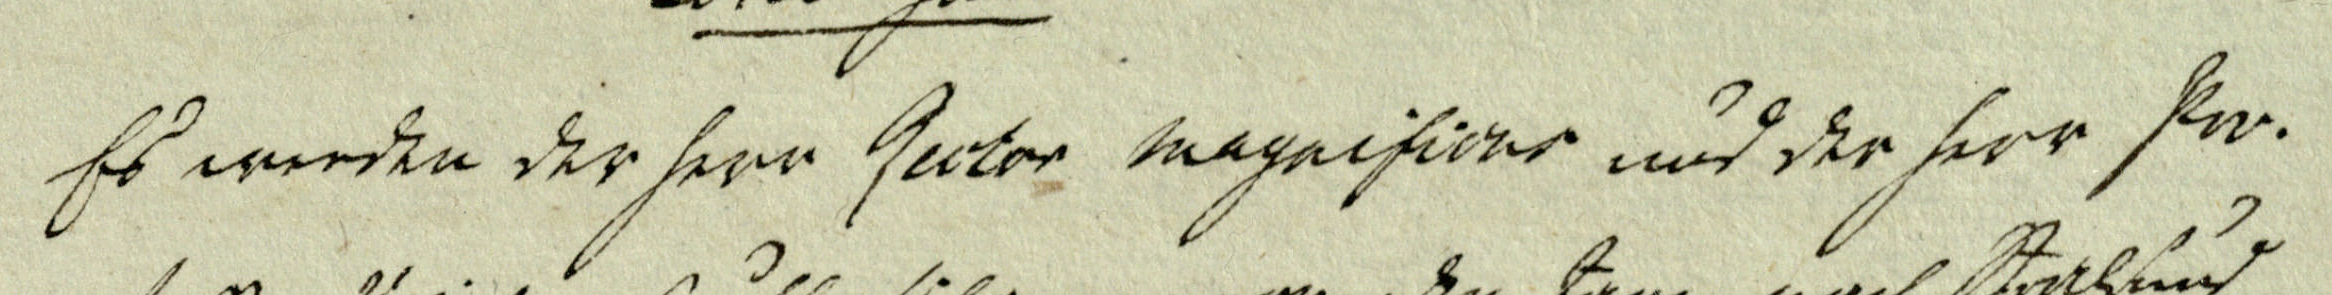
Es werden der Herr Rector Magnificus und der Herr Prof¬
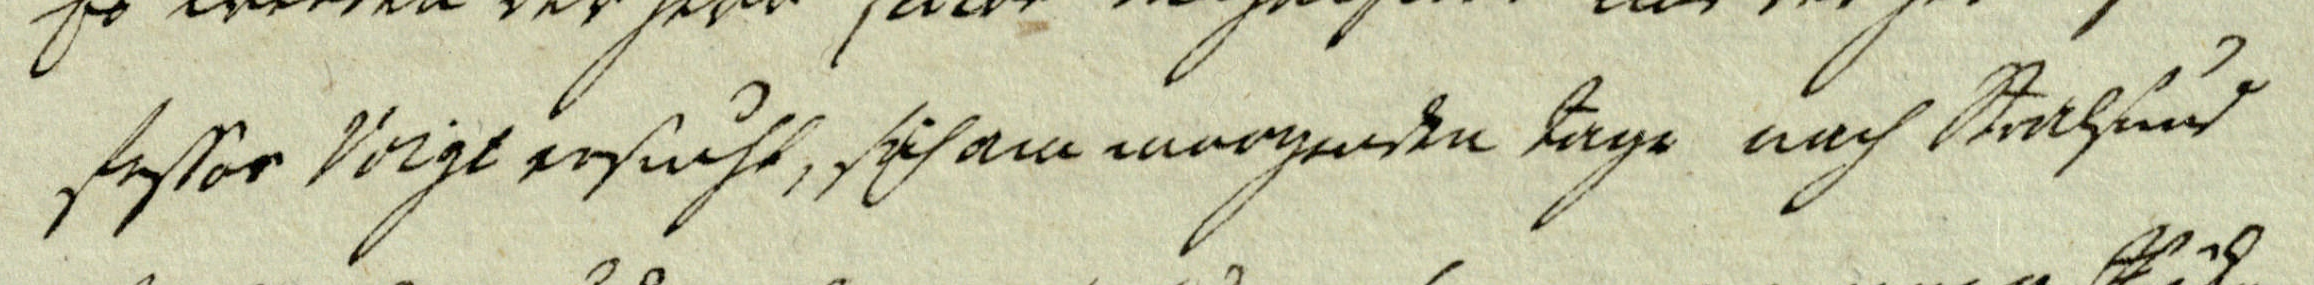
fessor Voigt ersucht, sich am morgenden Tage nach Stralsund
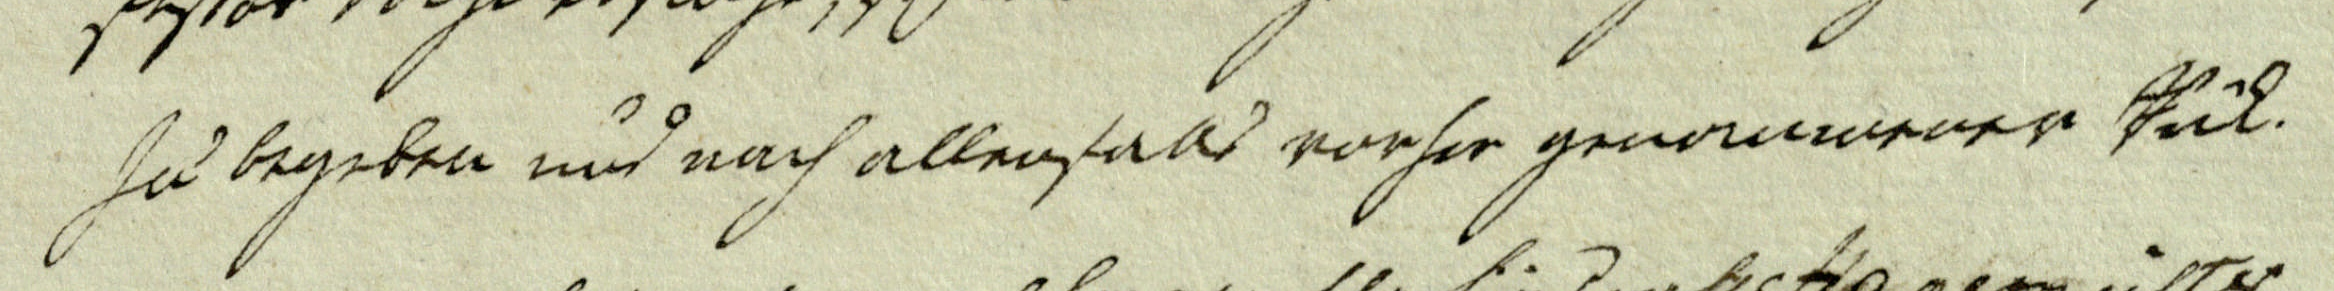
zu begeben und nach allenfalls vorher genommener Rück¬
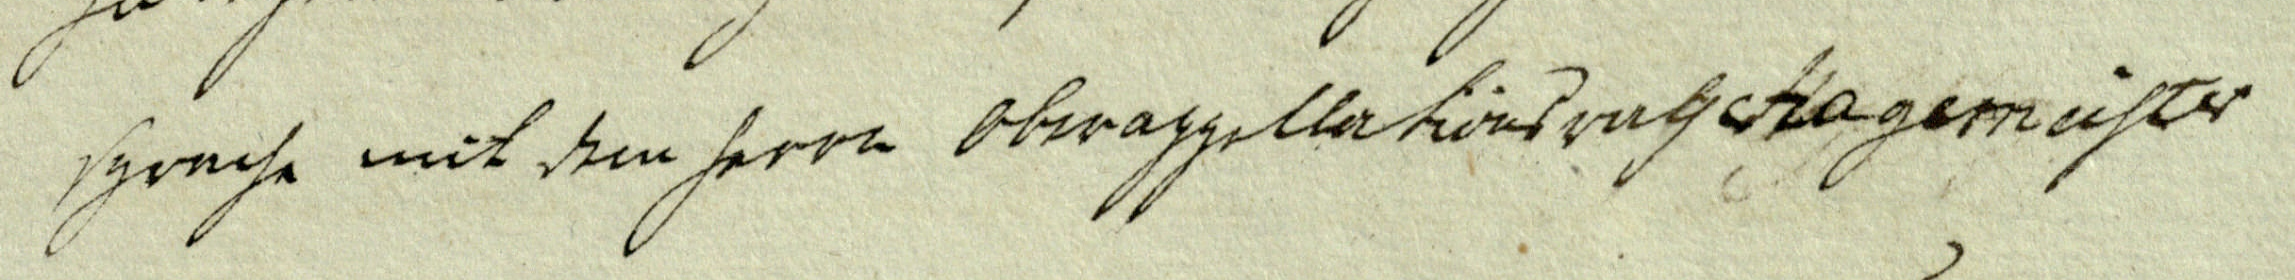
sprache mit dem Herrn Oberappellationsrath Hagemeister
